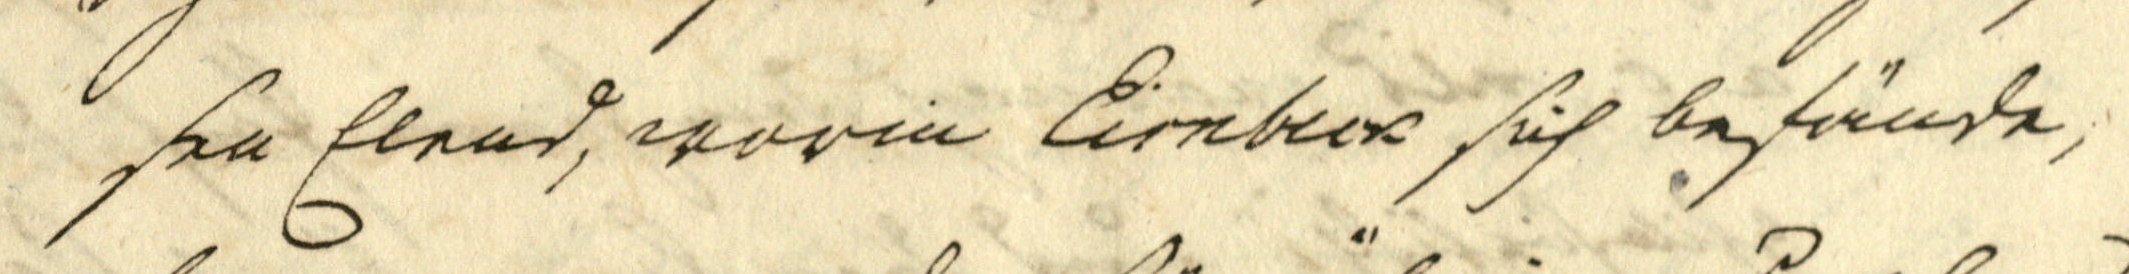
sen Elend, worin Eimbeck sich befände,
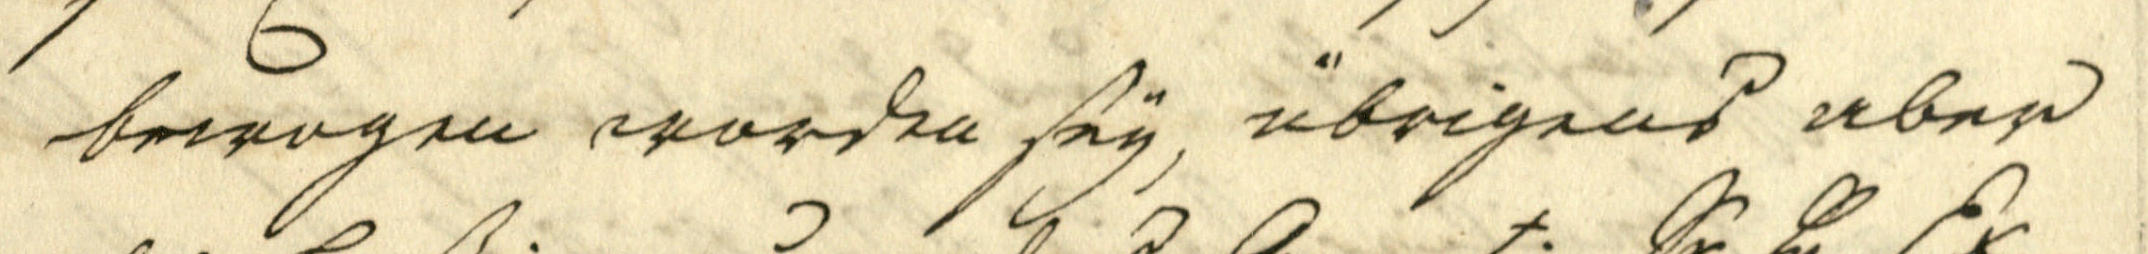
bewogen worden seÿ, übrigens aber
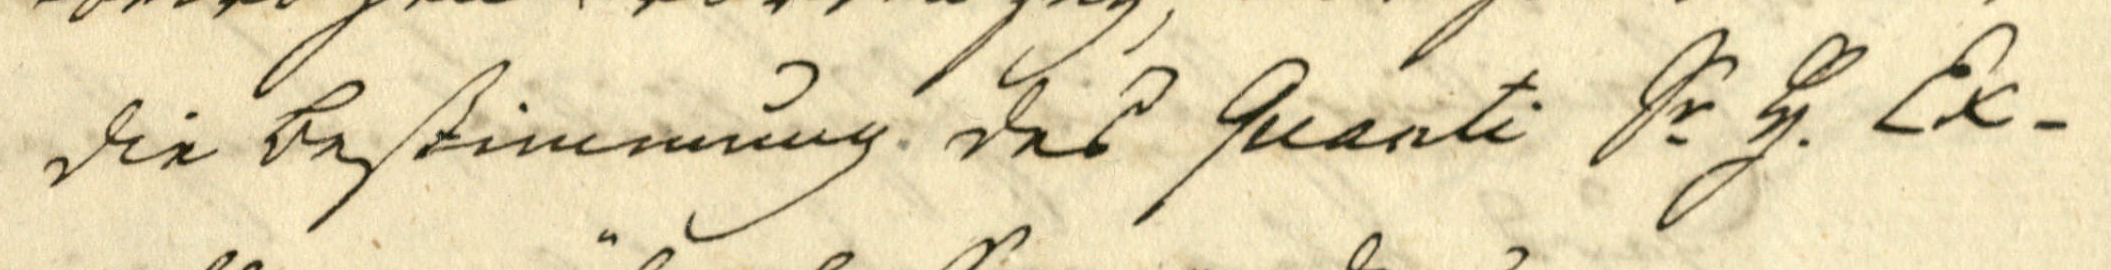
die Bestimmung des Quanti Sr H. Ex¬
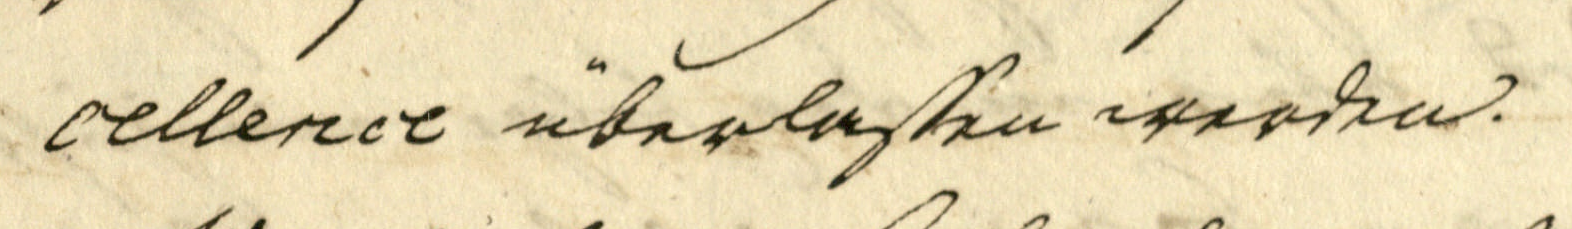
cellence überlassen werden.
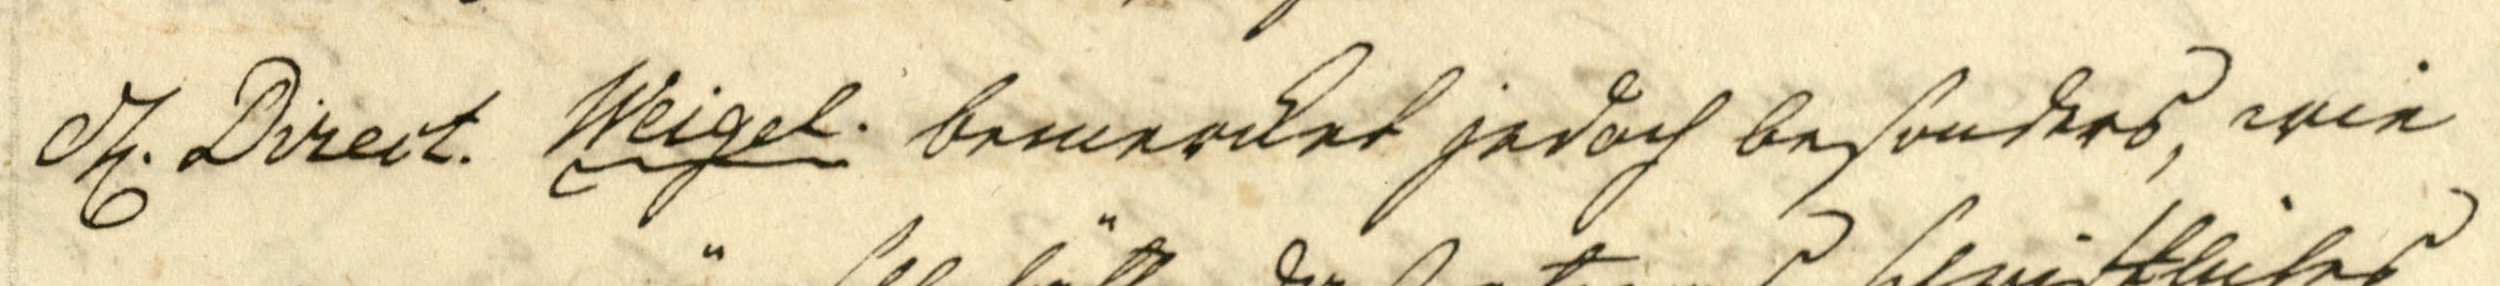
dh. Direct. Weigel. bemercket jedoch besonders, wie
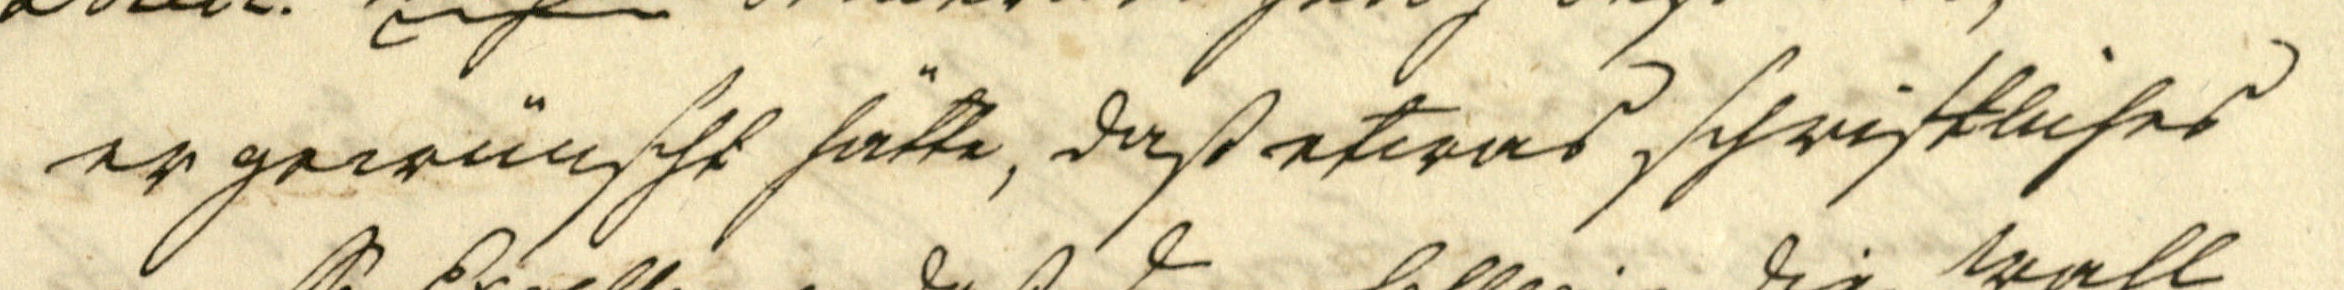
er gewünscht hätte, daß etwas schriftliches
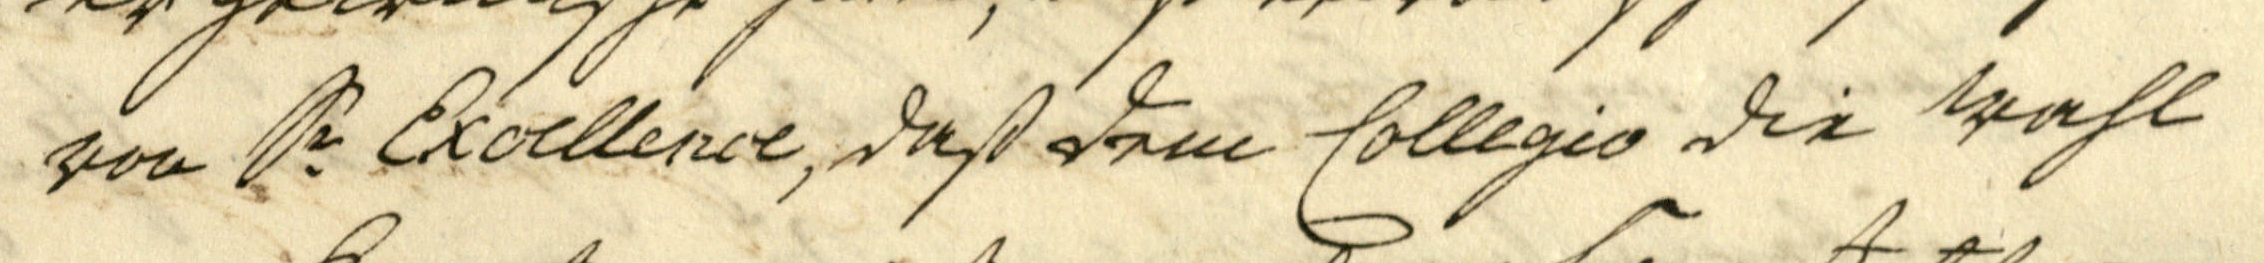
von Sr Excellence, daß dem Collegio die Wahl
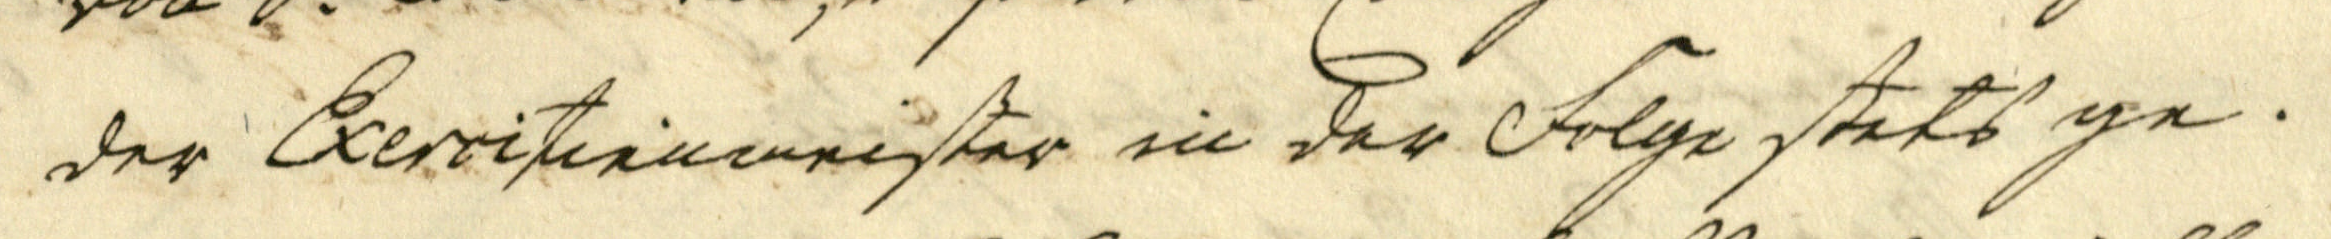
der Exercitienmeister in der Folge stets ge¬
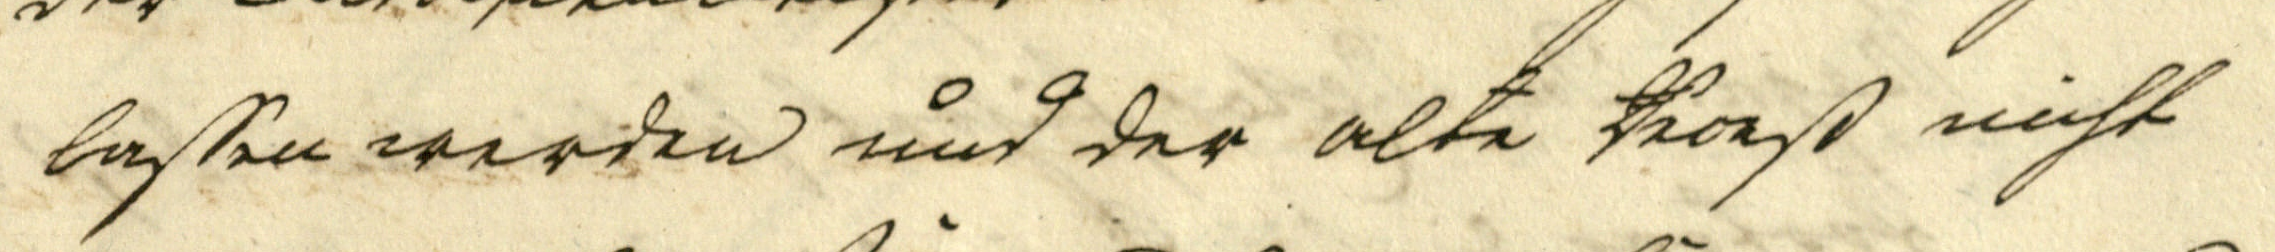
lassen werden und der alte Receß nicht
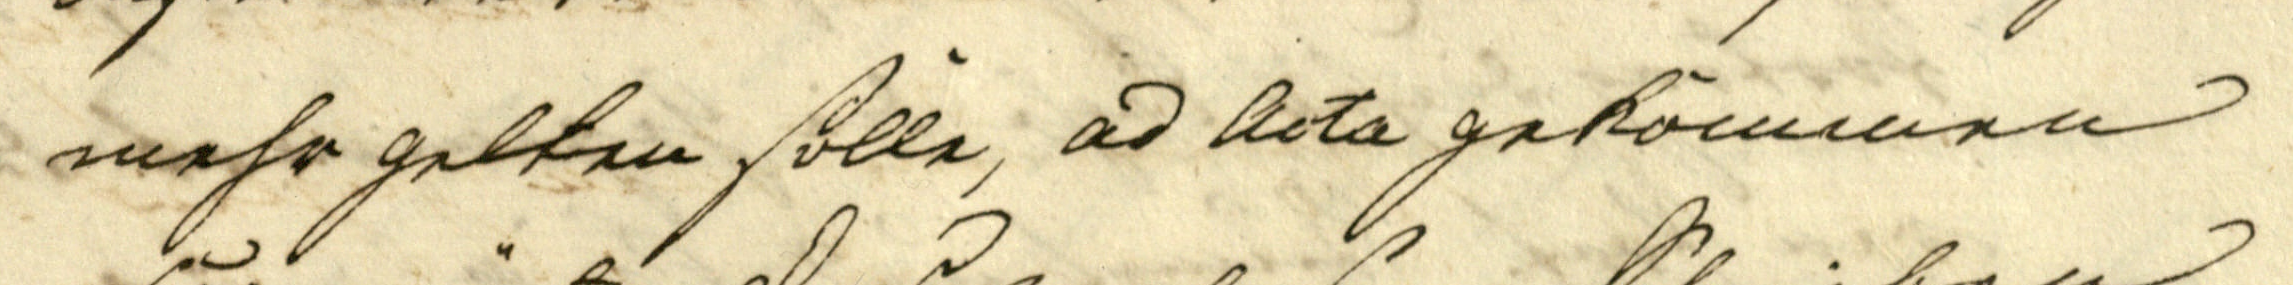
mehr gelten solle, ad Acta gekommen
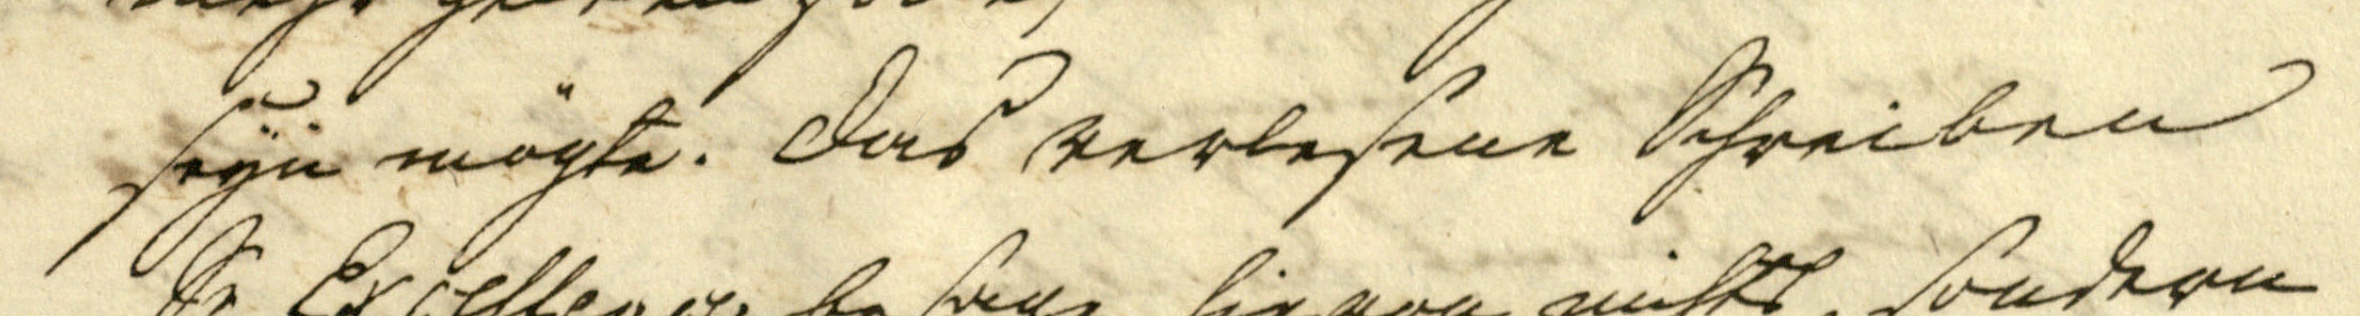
seÿn mögte. Das verlesene Schreiben
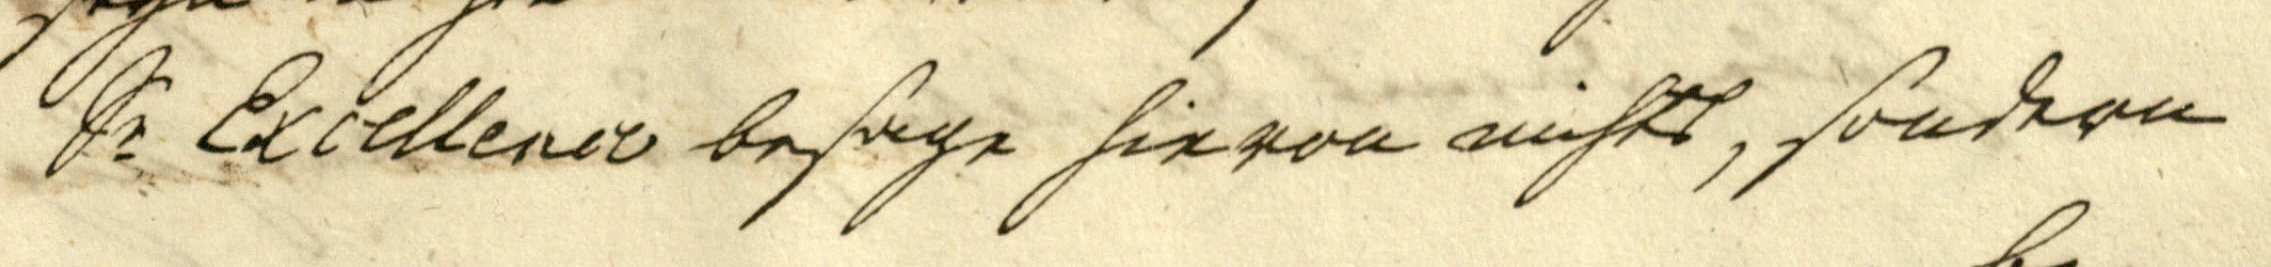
Sr. Excellence besage hievon nichts, sondern
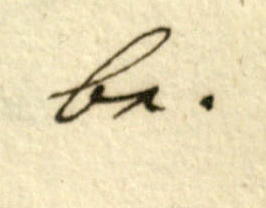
be.
